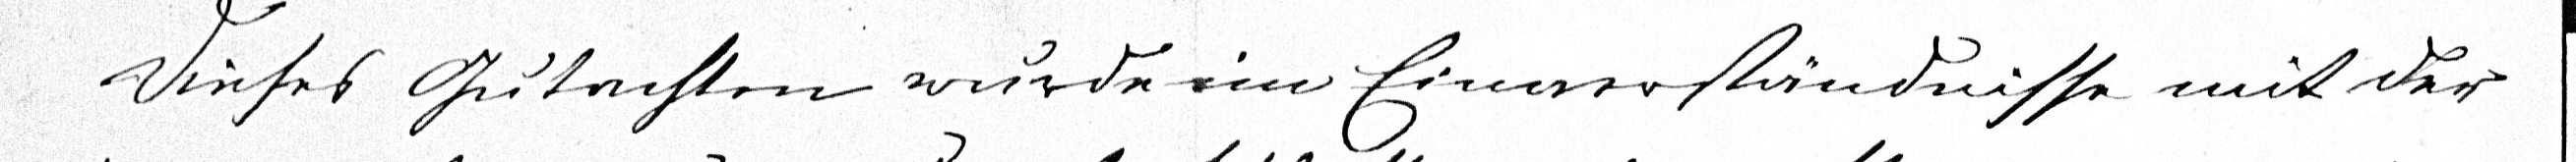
Dieses Gutachten wurde ein Einverständnisse mit der
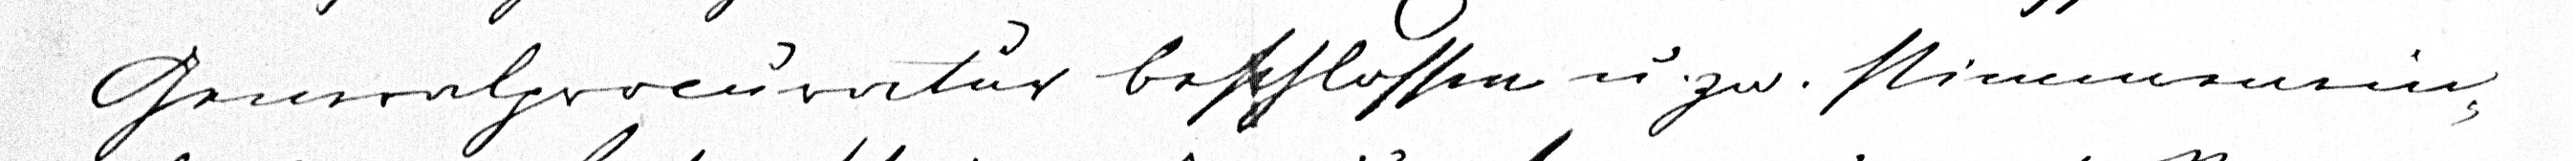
Generalprocuratur beschlossen u. zw. stimmenein¬
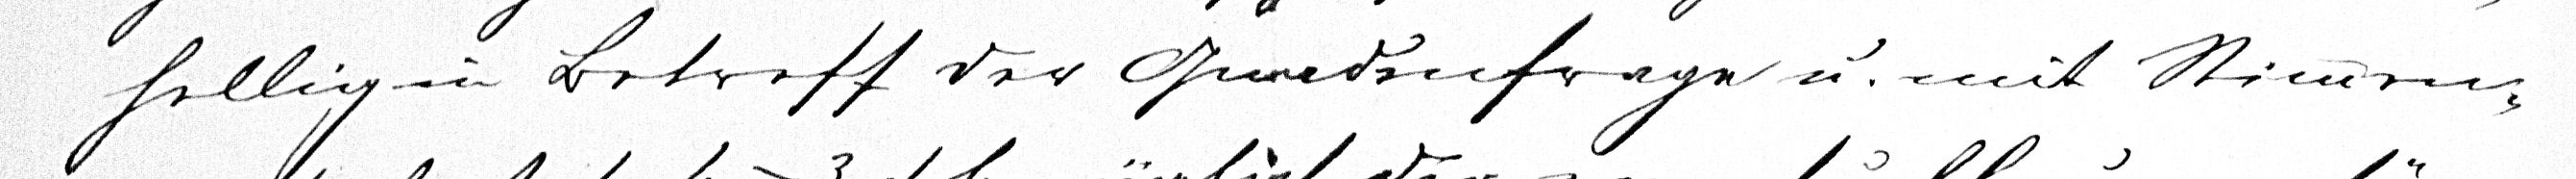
hellig in Betreff der Gnadenfrage u. mit Stinden¬
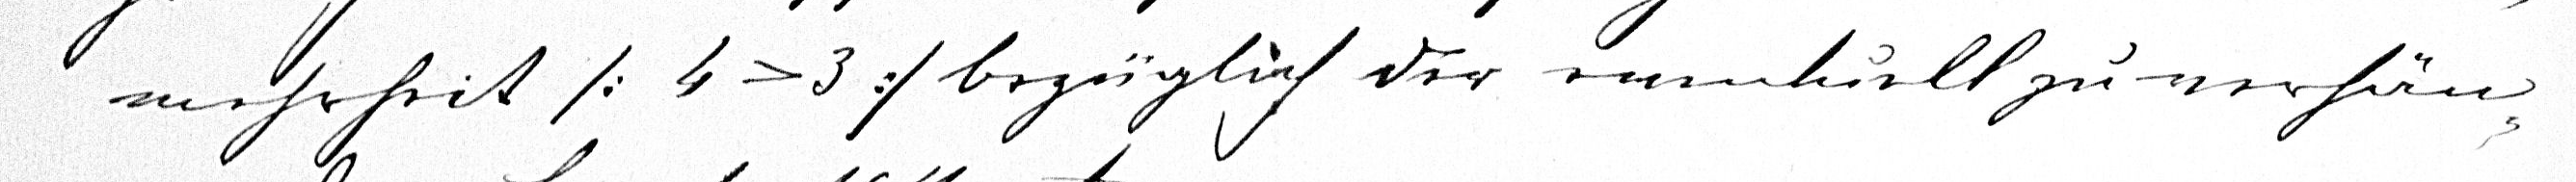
mehrheit /: 4>3 :/ bezüglich der eventuell verhän¬
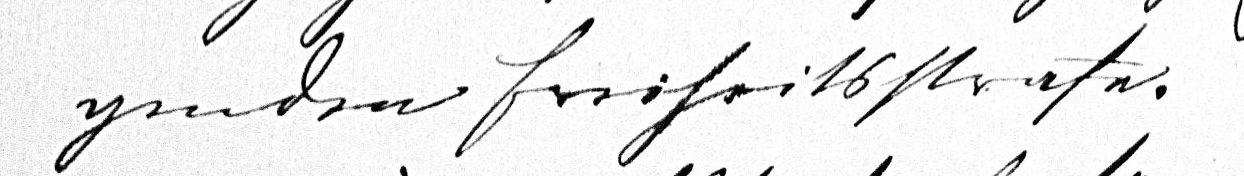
genden Freiheitsstrafe.
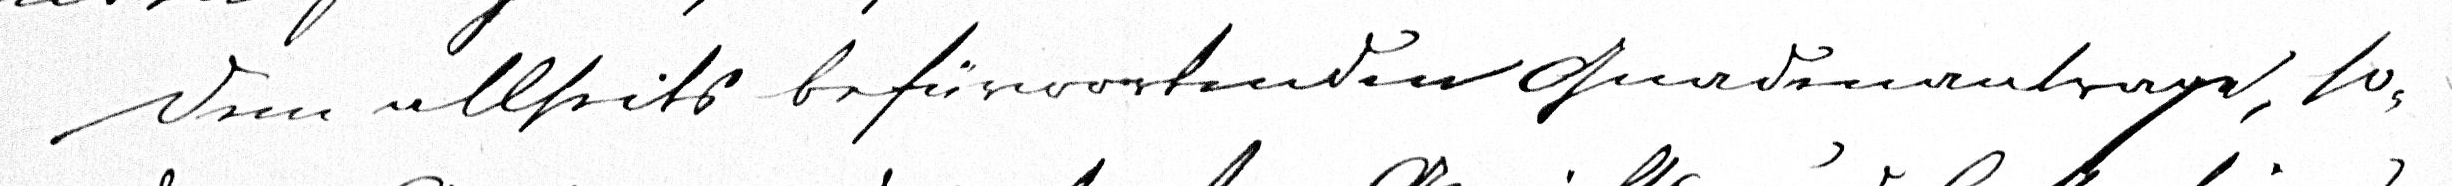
Dem allseits befürwortenden Gnadenantrage, so¬
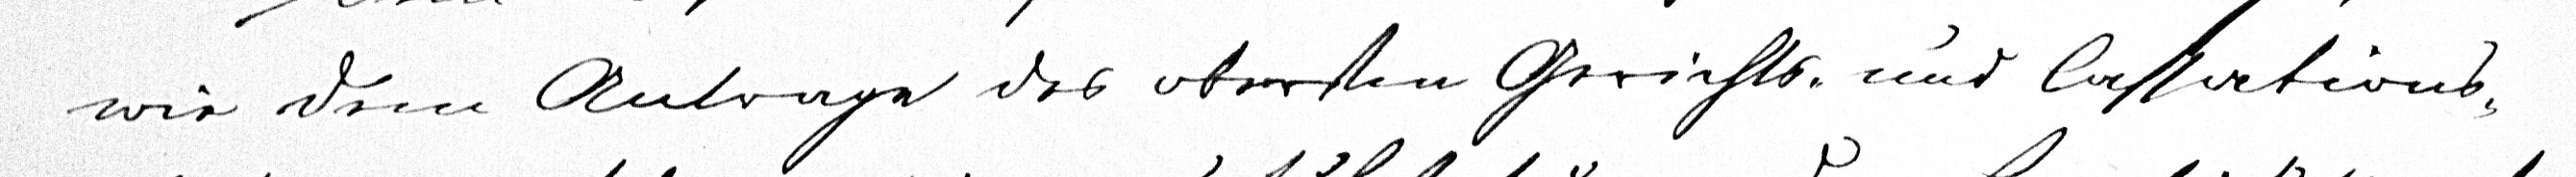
wie dem Antrage des obersten Gerichts- und Cassations¬
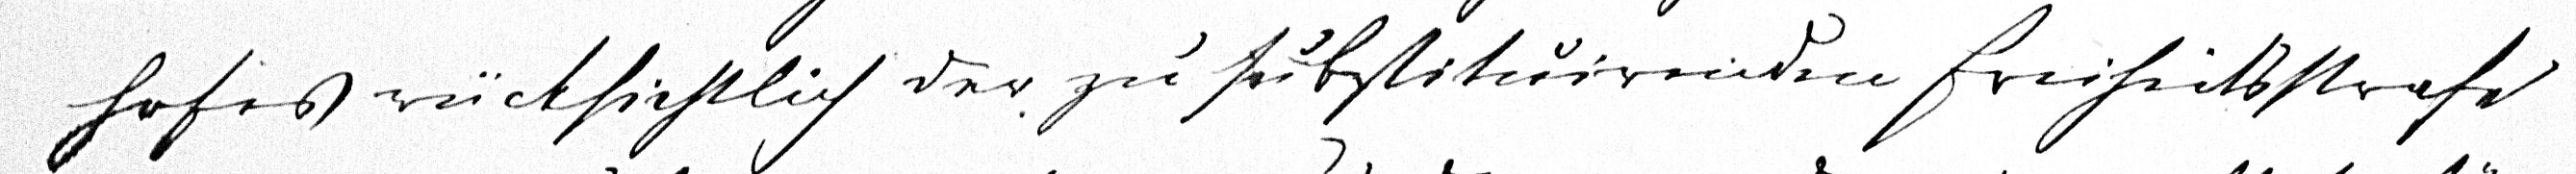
hofes rücksichtlich der zu substituirenden Freiheitsstrafe
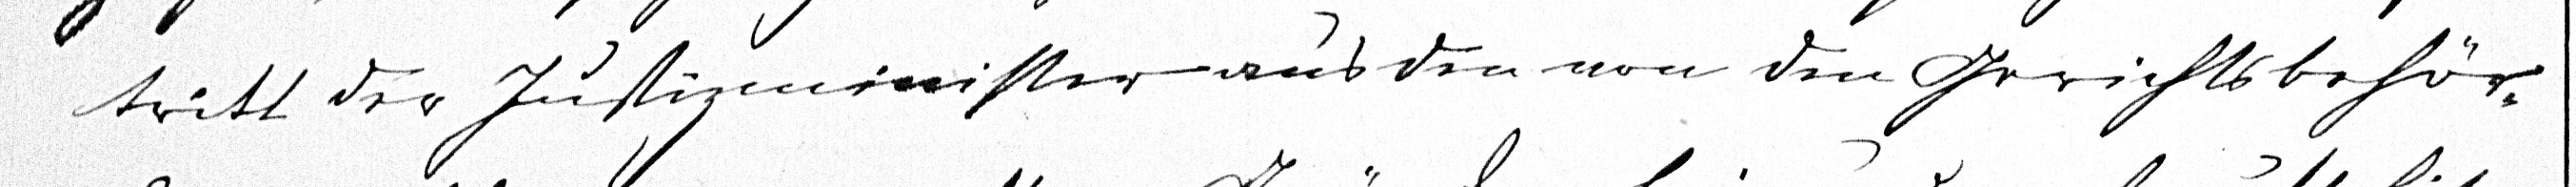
tritt der Justizminister aus den von den Gerichtsbehör¬
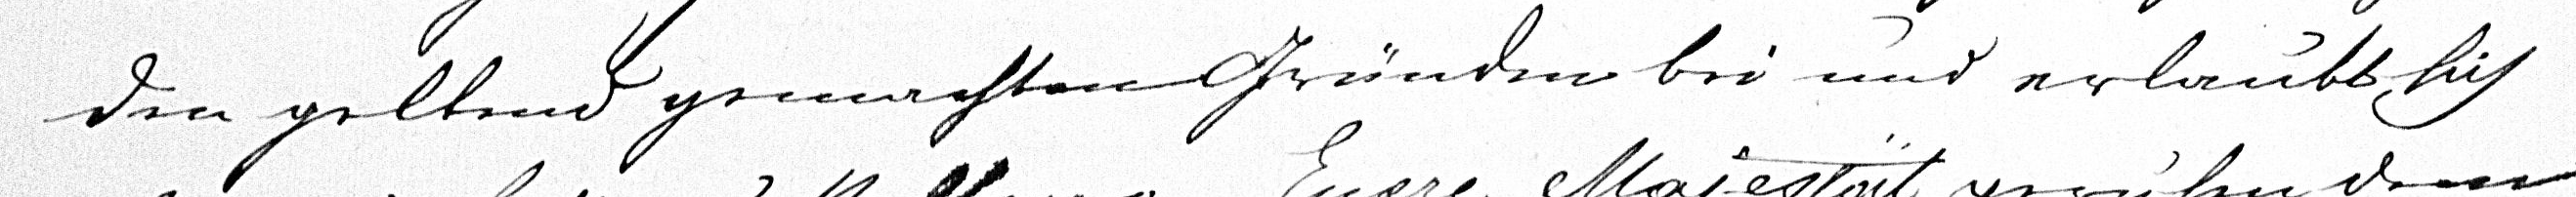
den geltend gemachten Gründen bei und erlaubt sich
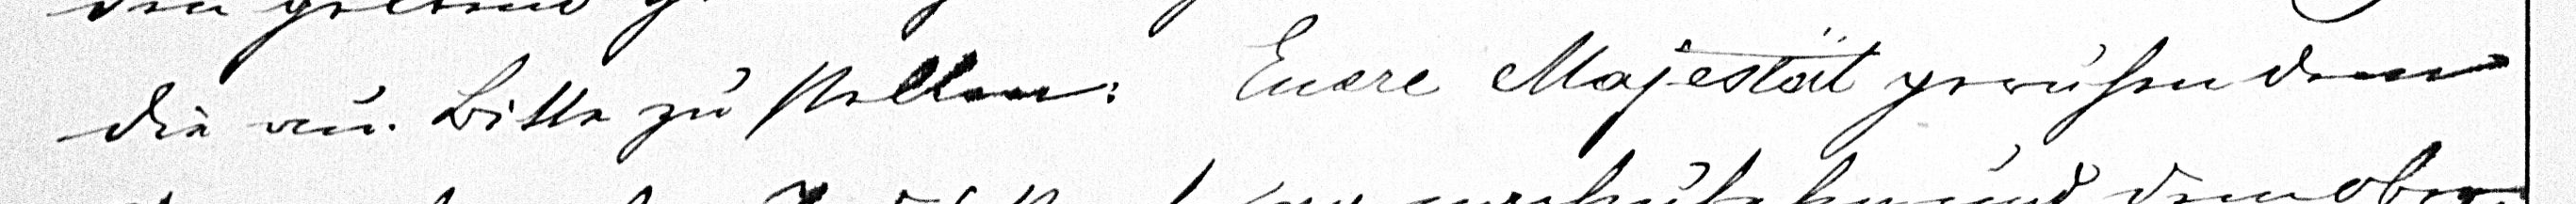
die au. Bitte zu stellen: EuereMajestät geruhen dem
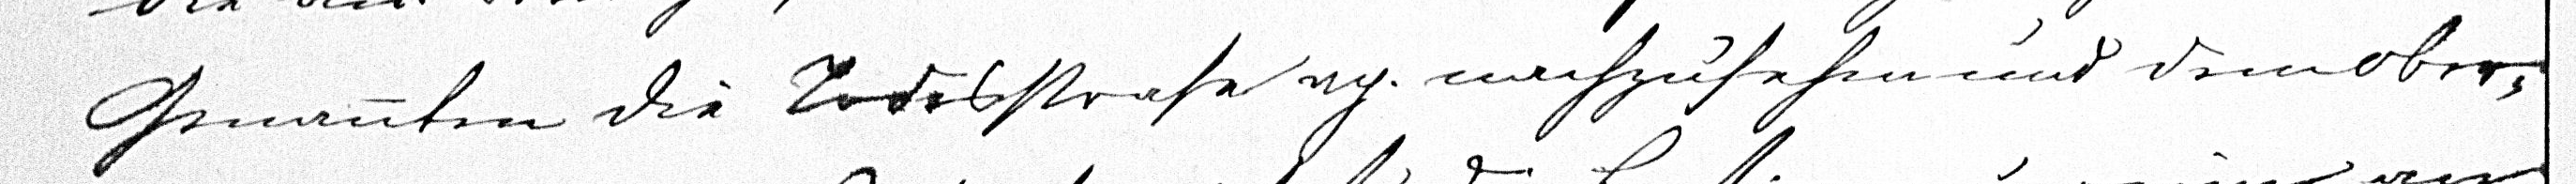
Genannten die Todesstrafe ag. nachzusehen und dem ober¬
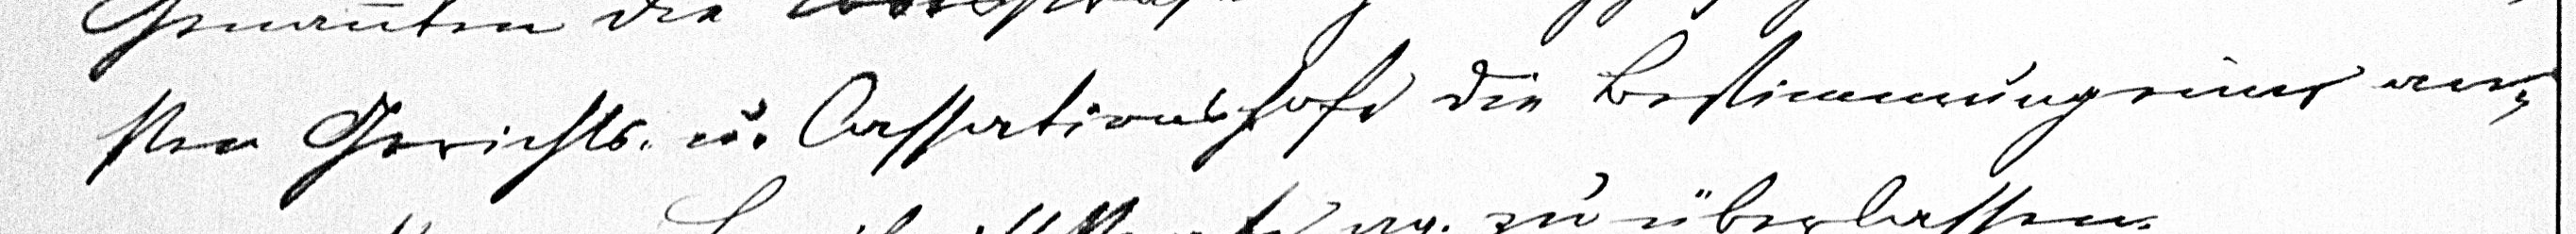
sten Gerichts- u. Cassationshofe die Bestimmung eines an¬
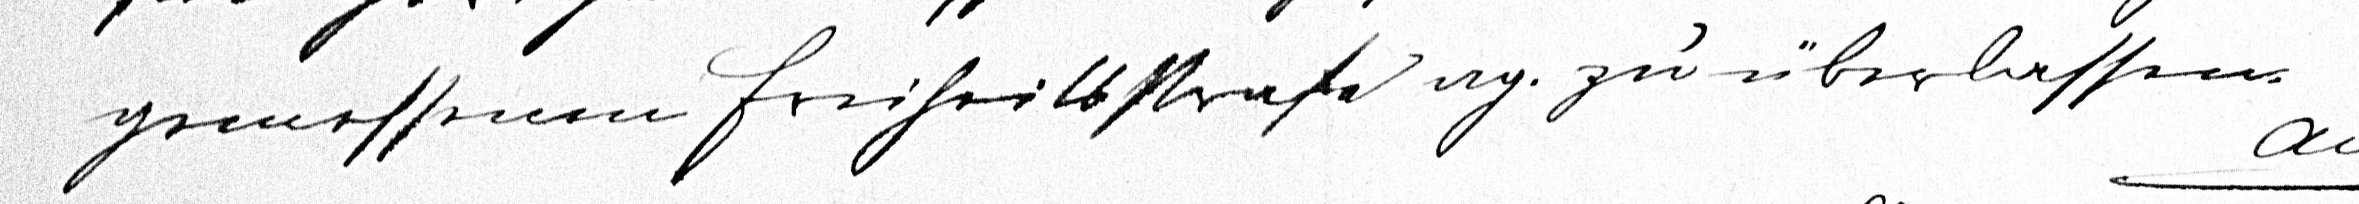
gemessenen Freiheitsstrafe ag. zu überlassen.
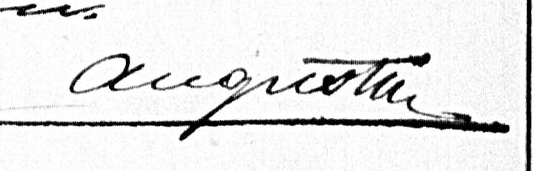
Augustin
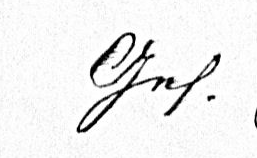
Geh.
